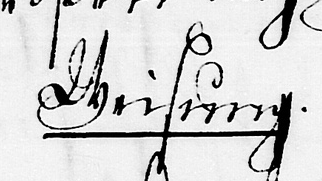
Weisung.
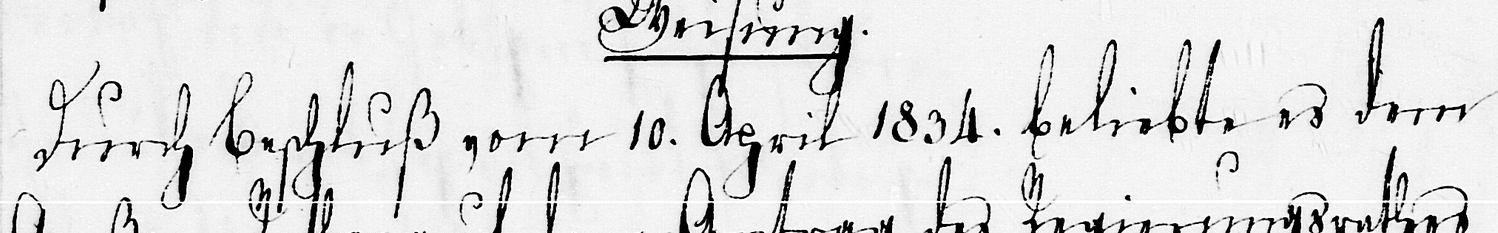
Durch Beschluß vom 10. April 1834. beliebte es dem
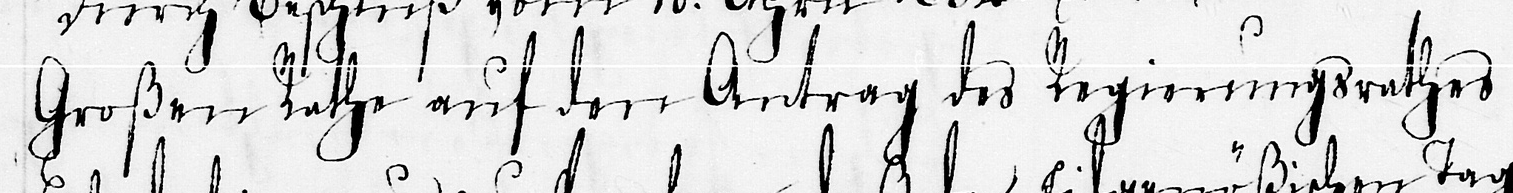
Großen Rathe auf den Antrag des Regierungsrathes
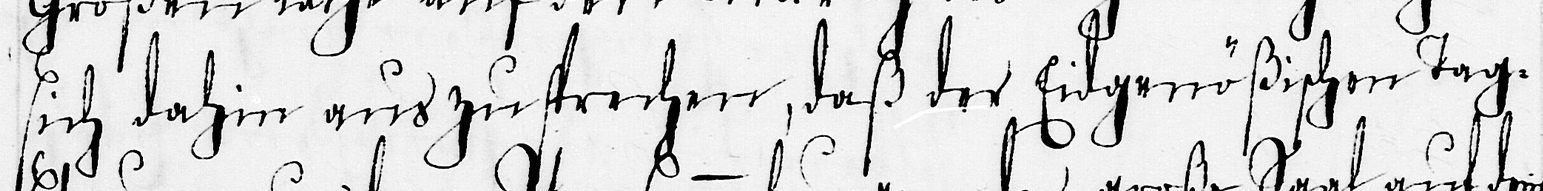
sich dahin auszusprechen, daß der Eidgenößischen Tag¬
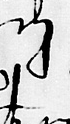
de
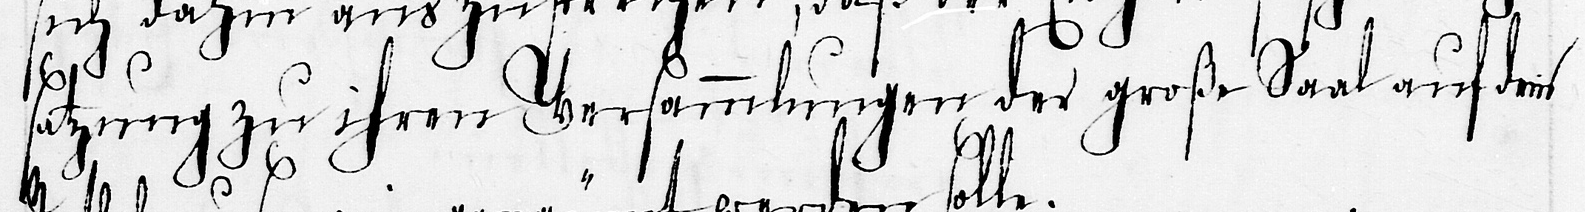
satzung zu ihren Versammlungen der große Saal auf dem
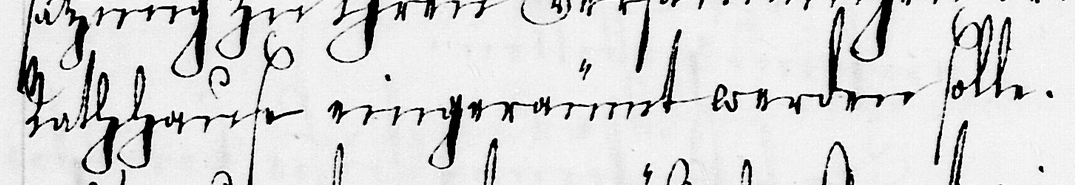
Rathhause eingeräumt werden solle.
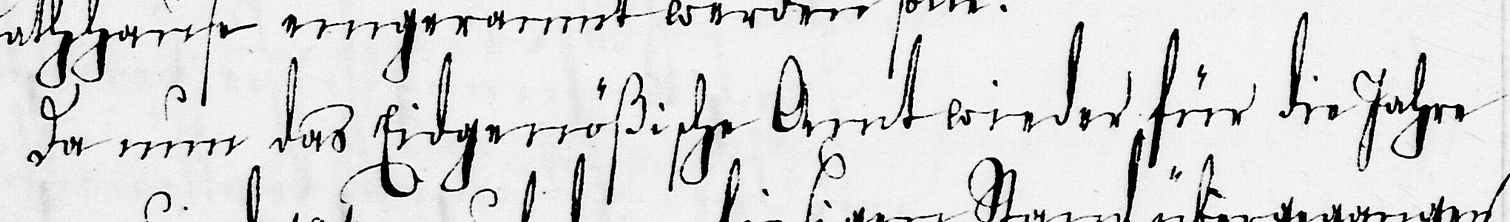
Da nun das Eidgenößische Amt wieder für die Jahre
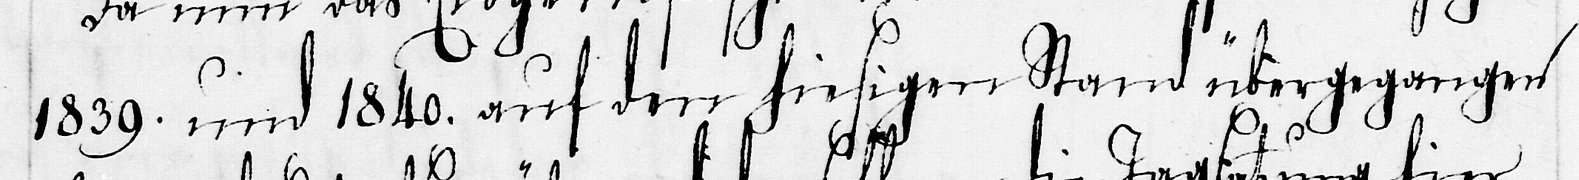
1839. und 1840. auf den hiesigen Stand übergegangen
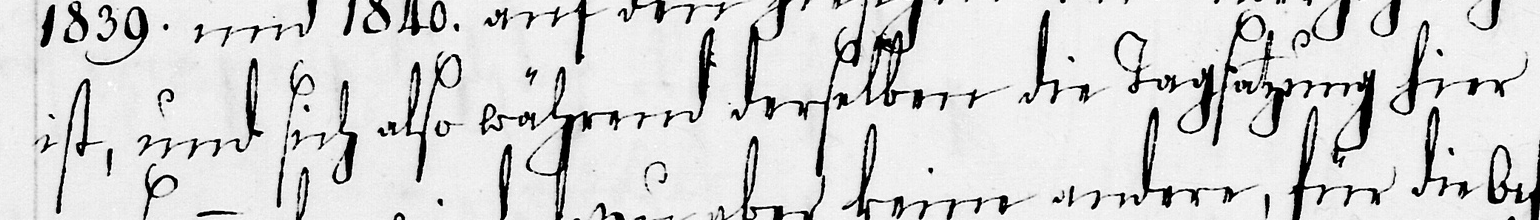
ist, und sich also während derselben die Tagsatzung hier
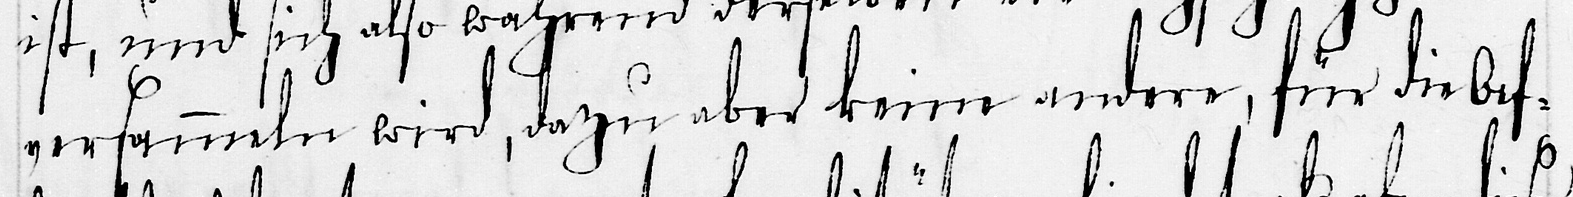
versammeln wird, dazu aber keine andere, für die Oef¬
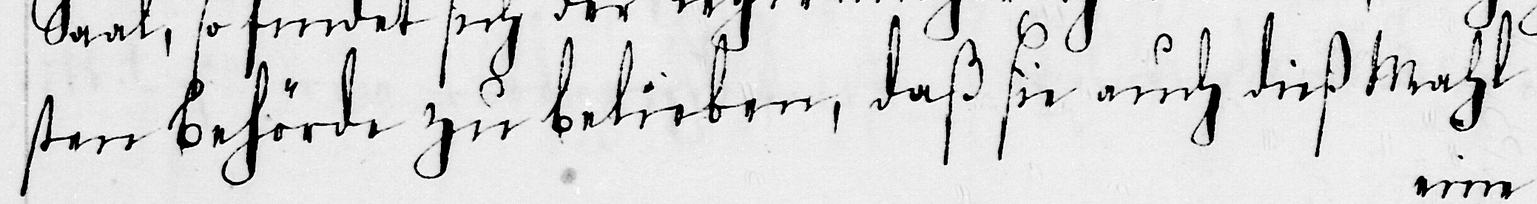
sten Behörde zu belieben, daß sie auch dieß Mahl
